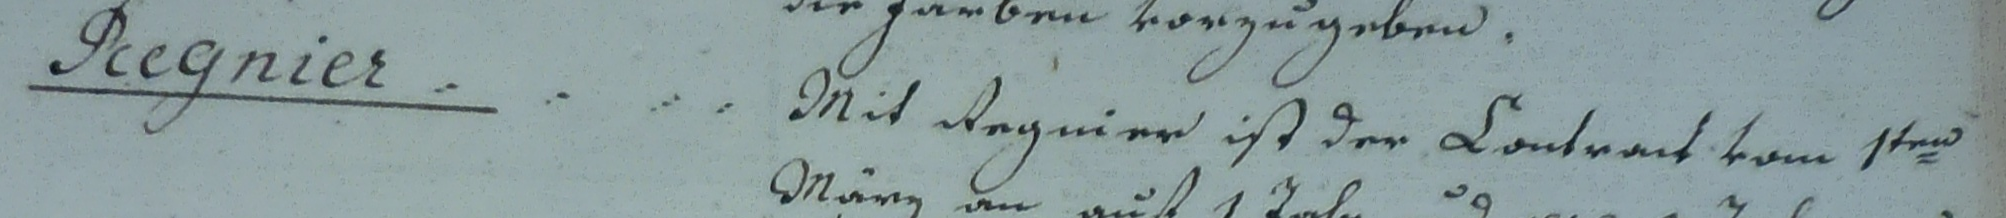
Regnier : : : : Mit Regnier ist der Contract vom 1te͇n
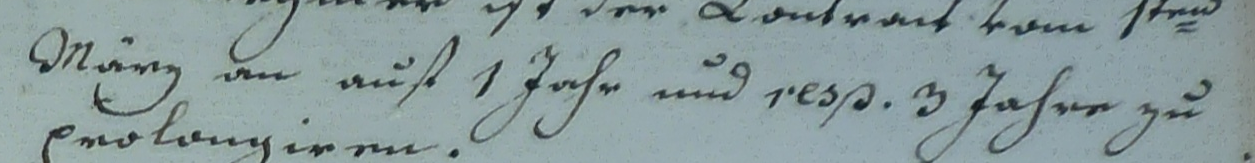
März an auf 1 Jahr und resp. 3 Jahre zu
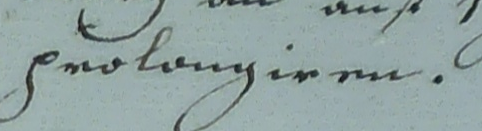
prolongiren.
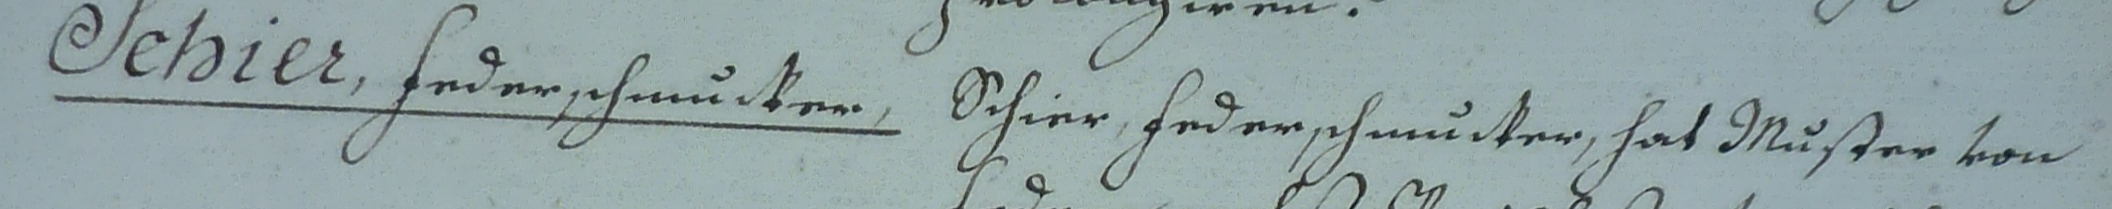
Schier, Federschmucker, Schier, Federschmucker, hat Muster von
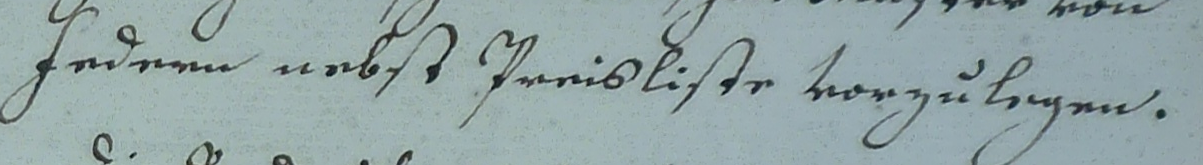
Federn nebst Preisliste vorzulegen.
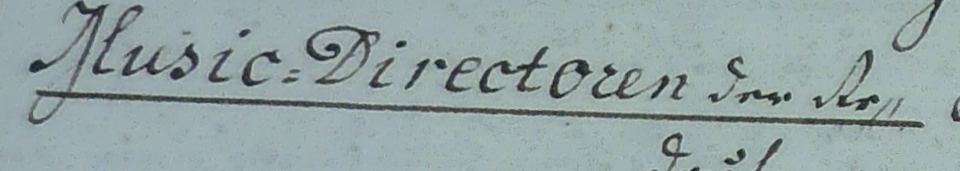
Music‗Directoren der Re¬
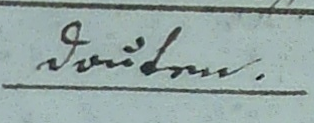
douten.
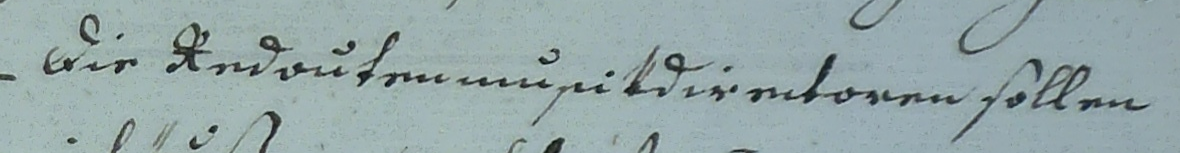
Die Redoutenmusikdirectoren sollen
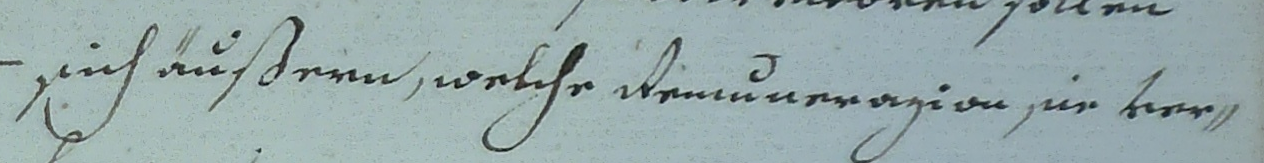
sich äußern, welche Remunerazion sie ver¬
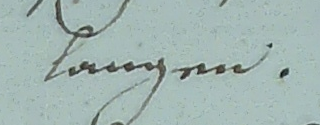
langen.
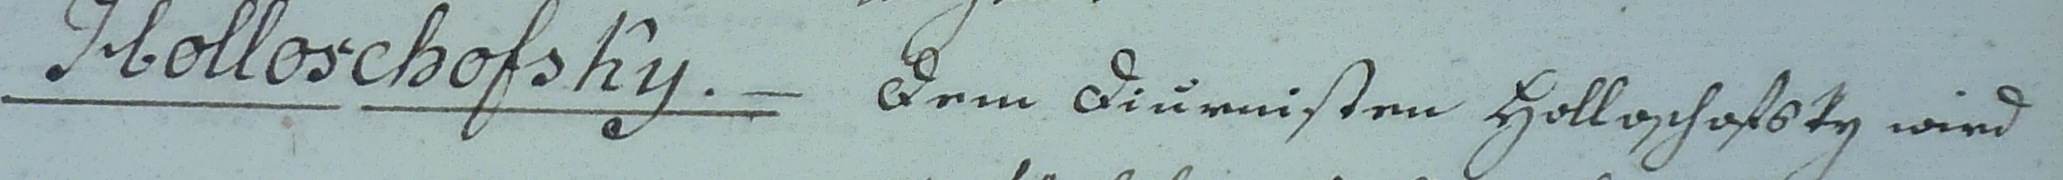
Holloschofsky. __ Dem Diurnisten Holloschofsky wird
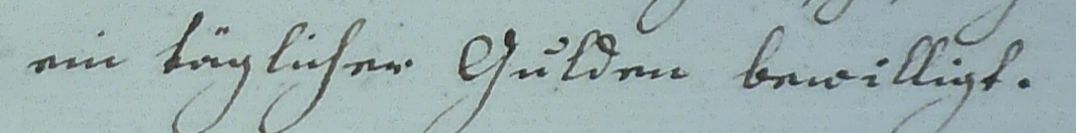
ein täglicher Gulden bewilligt.
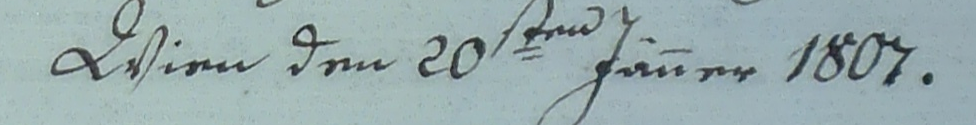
Wien den 20st͇en Jän̅er 1807.
